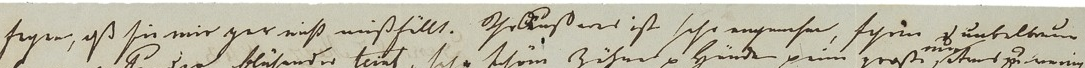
sagen, dß sie mir gar nicht mißfällt. Ihr Äußeres ist sehr angenehm,
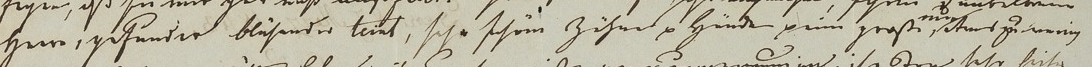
Haare, gesunder blühender teint, sehr schöne Zähne & Hände & eine große nur etwas zu wenig
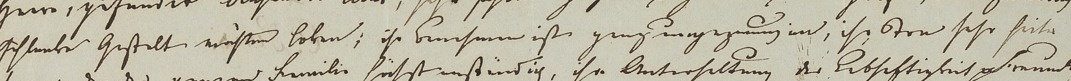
schlanke Gestalt möchten loken; ihr Benehmen ist ganz ungezwungen, ihr Ton sehr heiter
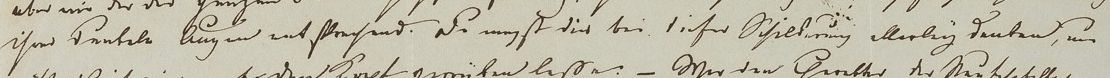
ihrer dunklen Augen entsprechend. Du magst dir bei dieser Schilderung allerley denken, nur
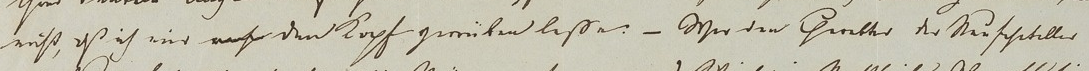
nicht, dß ich mir den Kopf verrüken lasse. – Was den Charakter der Neuschateller
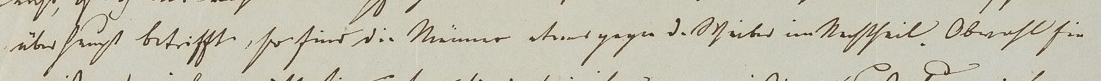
überhaupt betrifft, so sind die Männer etwas gegen d. Weiber im Nachtheil. Obwohl sie
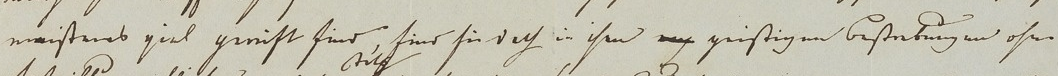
meistens viel gereist sind, sind sie doch in ihrn geistigen Bestrebungen ohne
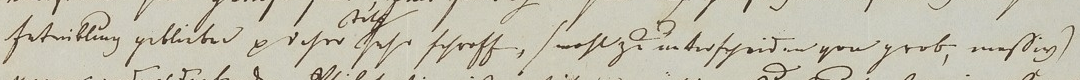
Entwiklung geblieben & daher stets sehr schroff, (wohl zu unterscheiden von grob, massiv)
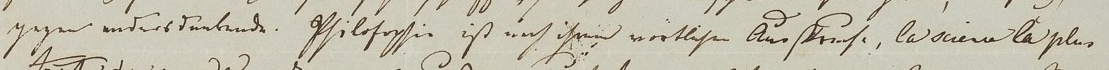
gegen andersdenkende. Philosophie ist nach ihrem wörtlichen Ausspruche, la science la plus
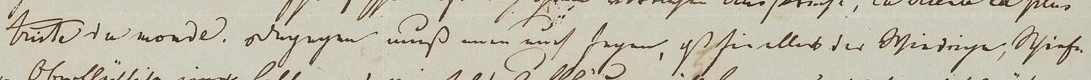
triste du monde. Dagegen muß man auch sagen, dß sie alles das Wiedrige, Schiefe
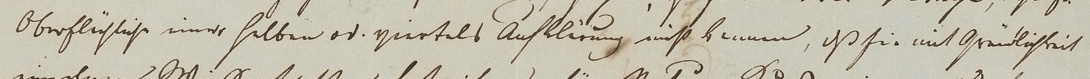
Oberflächliche einer halben od. viertels Aufklärung nicht kennen, dß sie mit Gründlichkeit
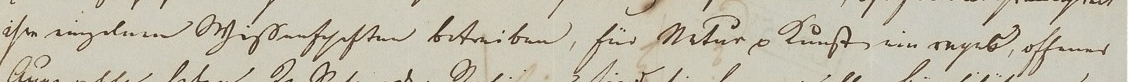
ihre einzelnen Wissenschaften betreiben, für Natur & Kunst ein reges, offenes
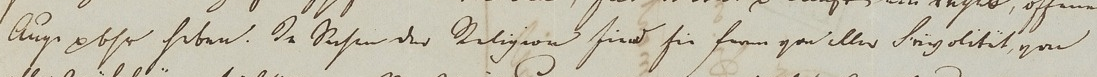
Auge & Ohr haben. In Sachen der Religion sind sie ferne von aller Frivolität, von
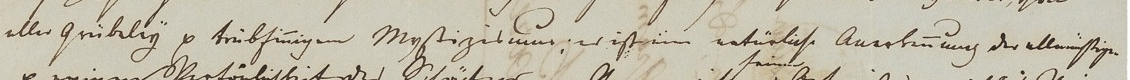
aller Grübeley & trübsinnigem Mystizismus; es ist eine natürliche Anerkennung der allmächtigen
